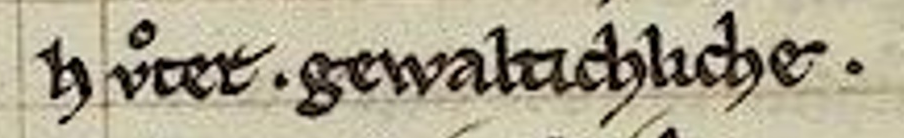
Hv°oter. gewaltichliche.
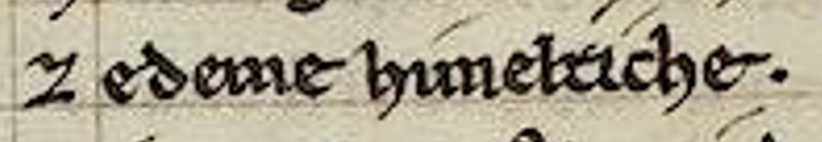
Zedeme himelriche.
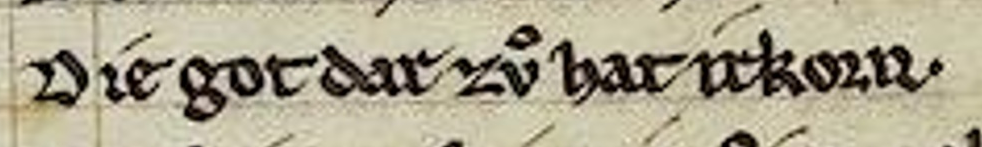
Die got dar zv°o hat irkorn.
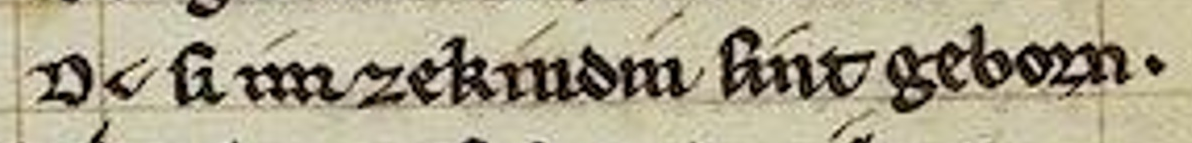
D(az) ſi im zekindin ſint geborn.
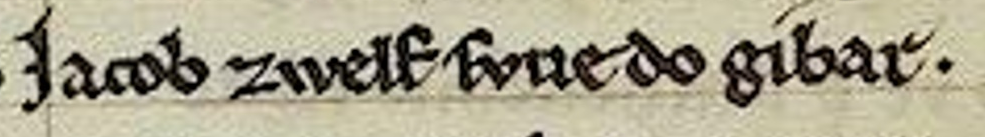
Jacob zwelf ſvne do gibar.
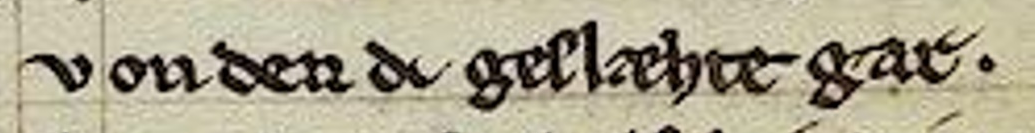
Von den d(az) geſl[ae]hte gar.
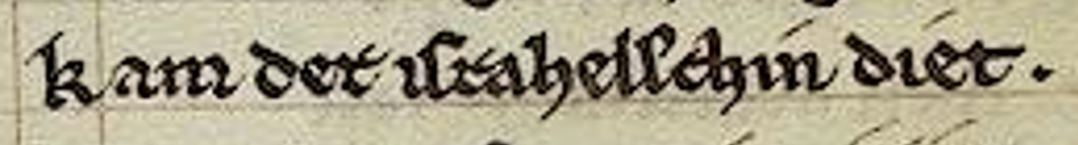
Kam der iſrahelſchin diet.
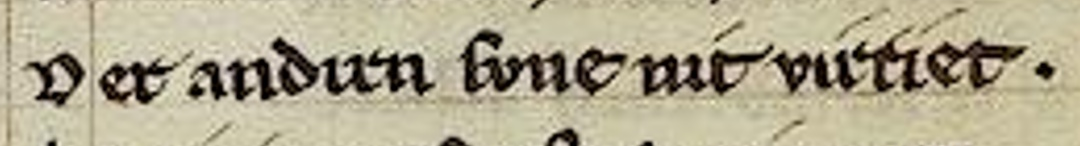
Der andirn ſvne nit virriet.
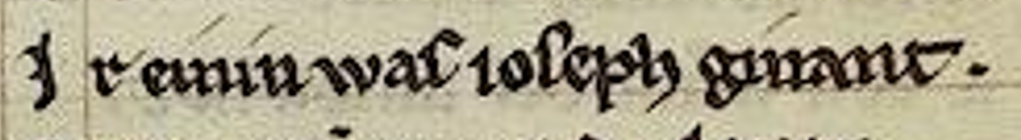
Ir einin waſ ioſeph ginant.
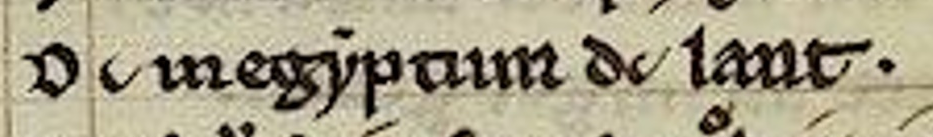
D(az) in egyptum d(az) lant.
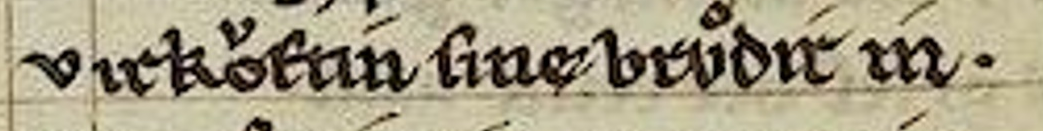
Virko°vftin ſine brv°odir in.
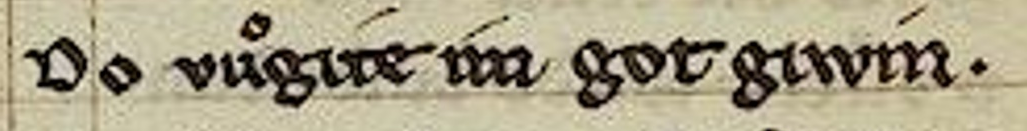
Do vu°ogite im got giwin.
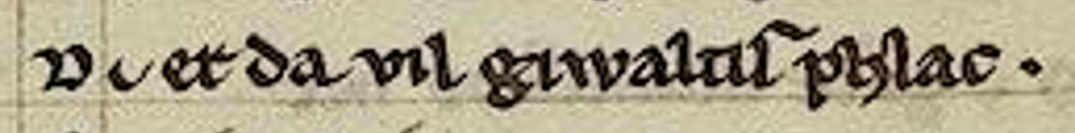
D(az) er da vil giwaltiſ phlac.
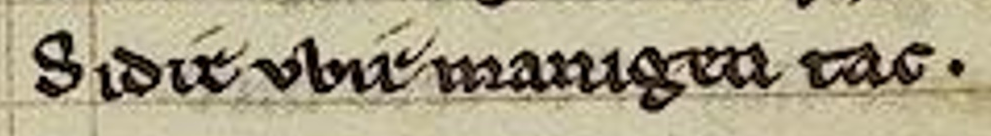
Sidir vbir manigen tac.
